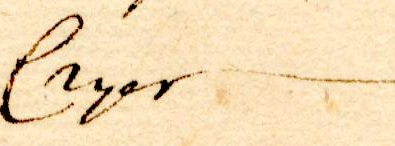Cryer
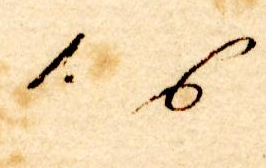1.6
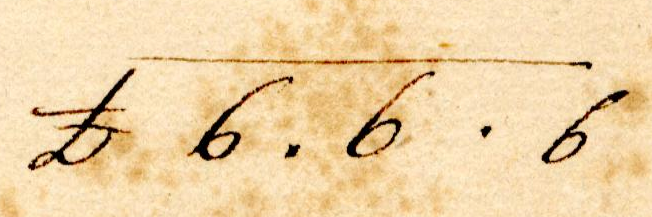£6.6.6
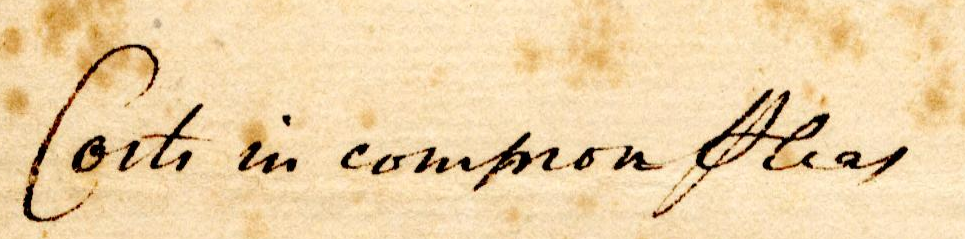Corts in common pleas
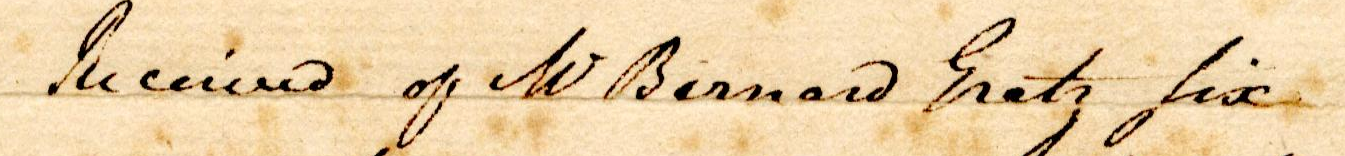Received of M^r Barnard Gratz six
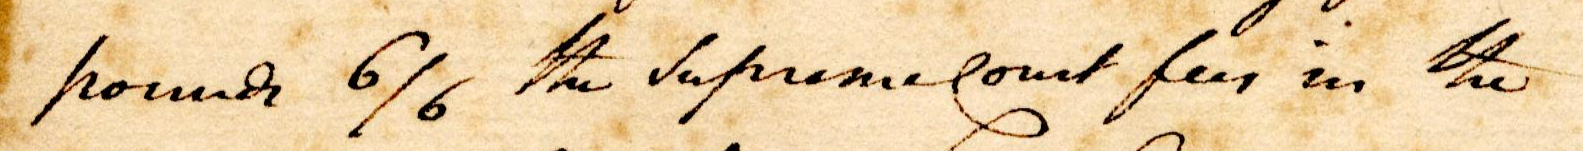pounds 6s6 the Supreme court fees in the
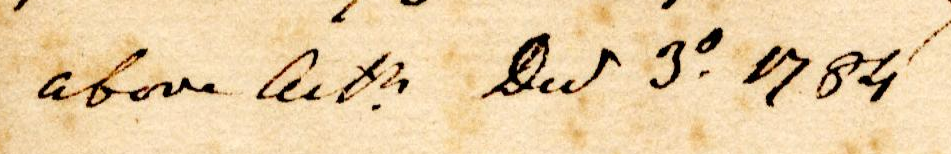above acco^ts Dec 3^d 1784
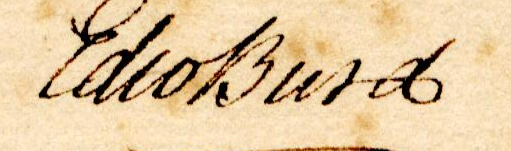Edw Burd
